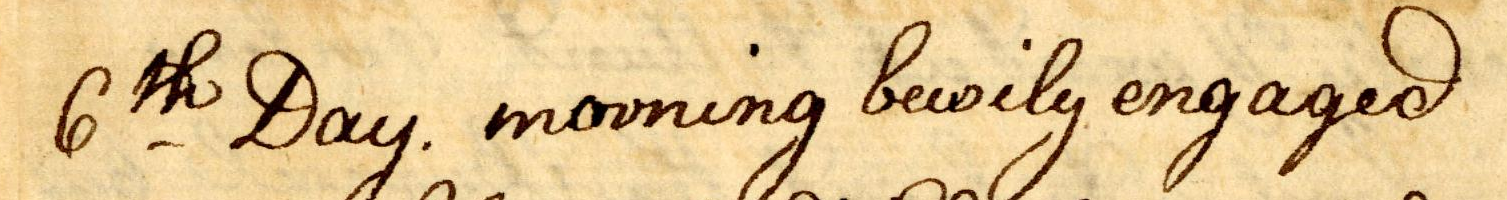6^th Day. morning busily engaged
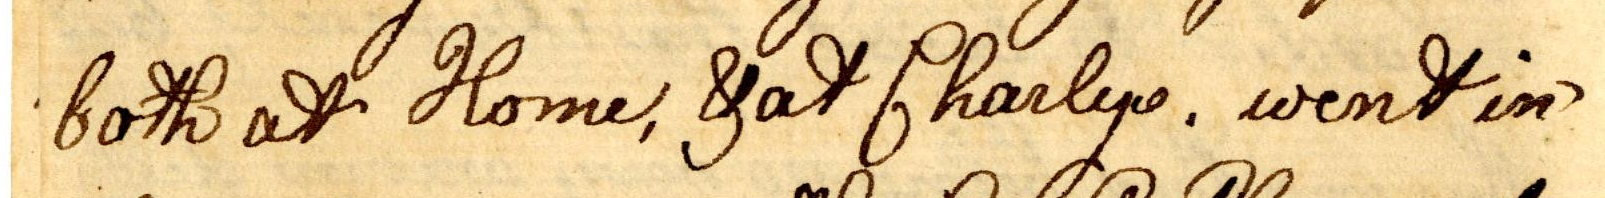both at Home, & at Charlys. went in
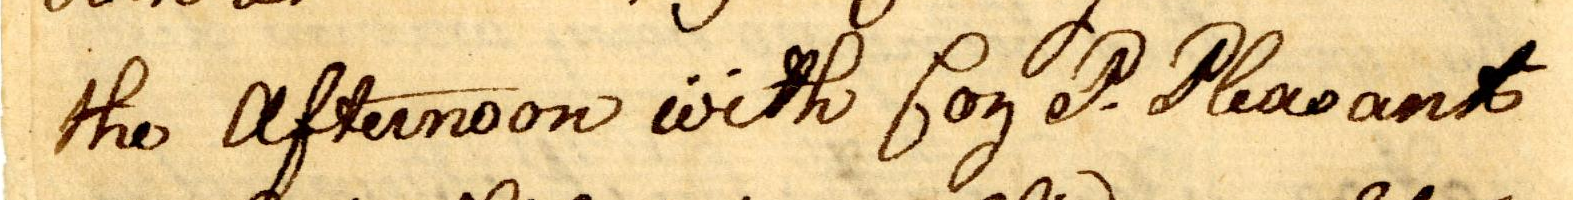the Afternoon with Coz P. Pleasants
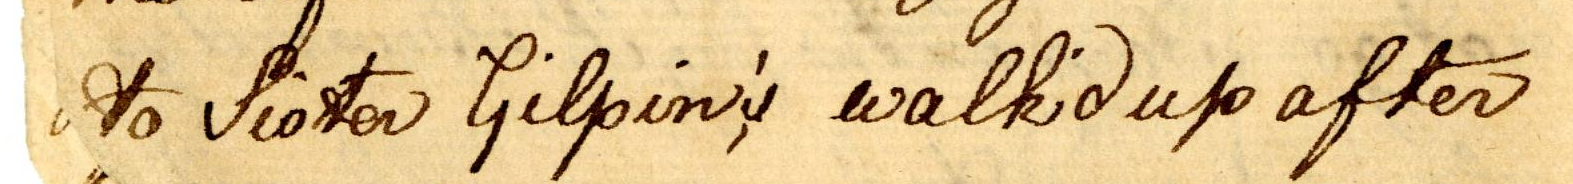to Sister Gilpin's, walk'd up after
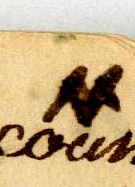11
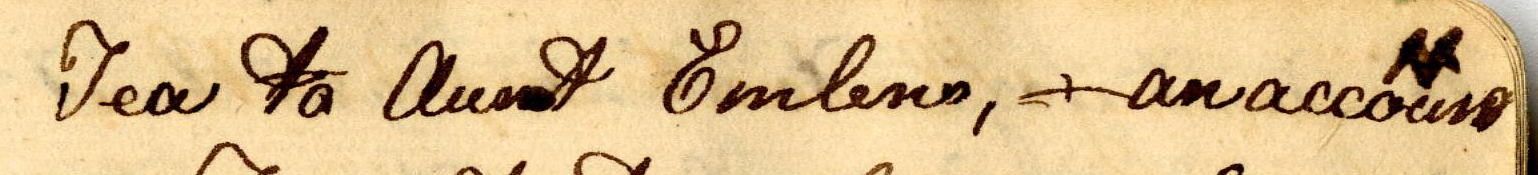Tea to Aunt Emlens,- an account
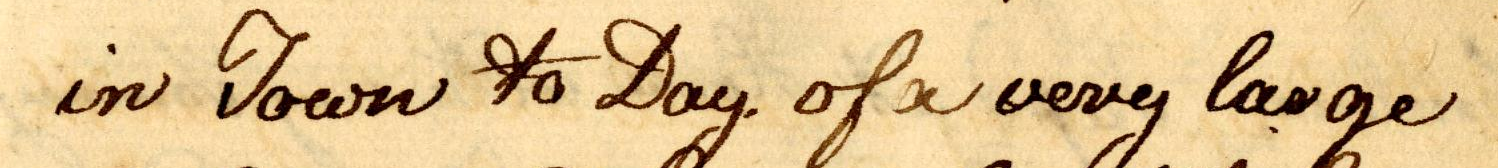in Town to Day. of a very large
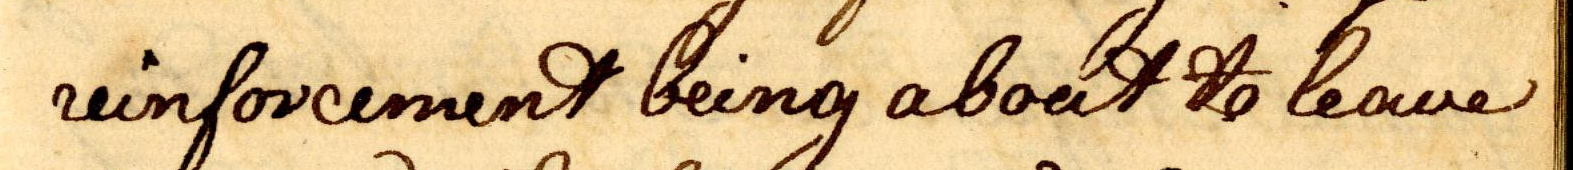reinforcement being about to leave
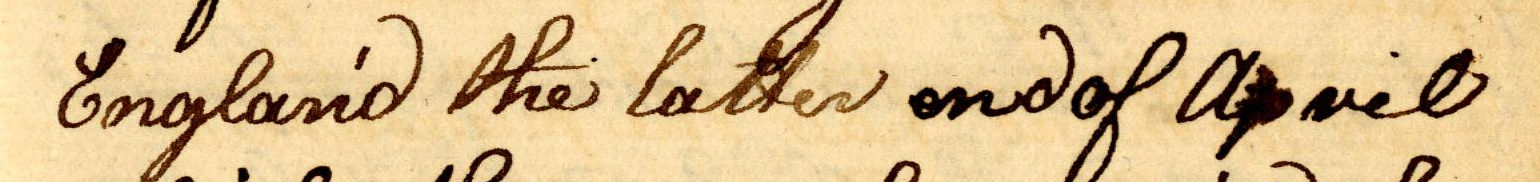England the latter end of April
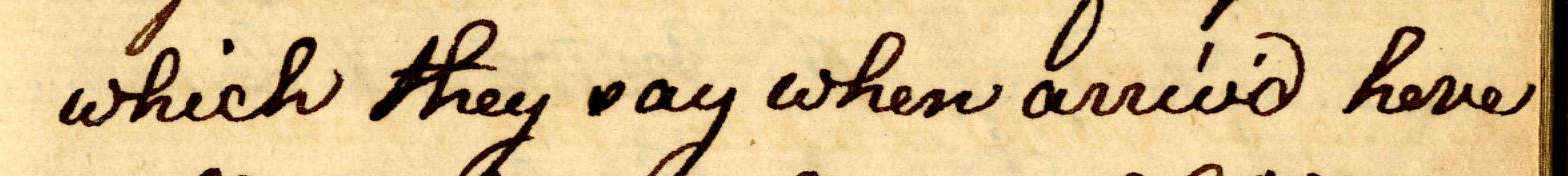which they say when arriv'd here
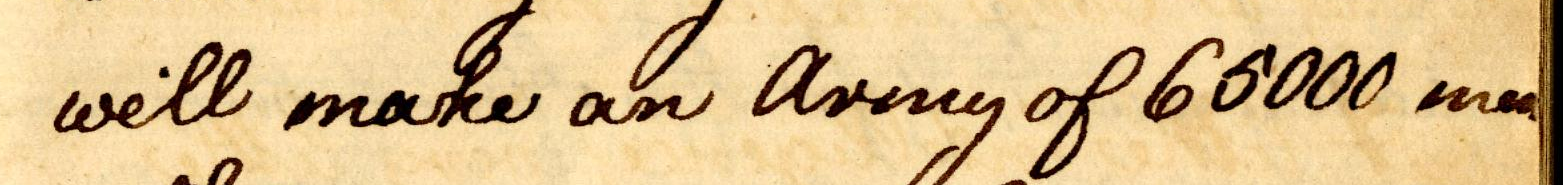will make an Army of 65000 men
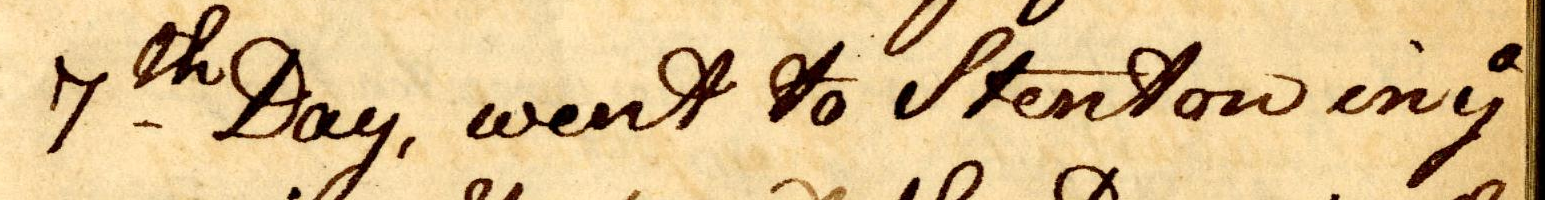7^th Day, went to Stenton in y^e
